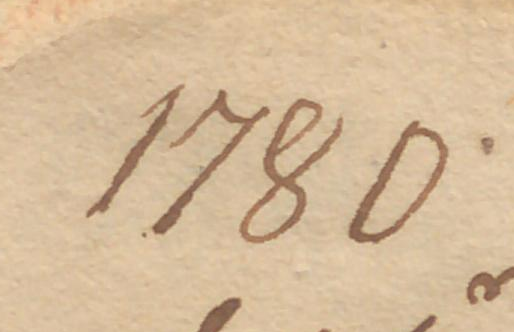1780
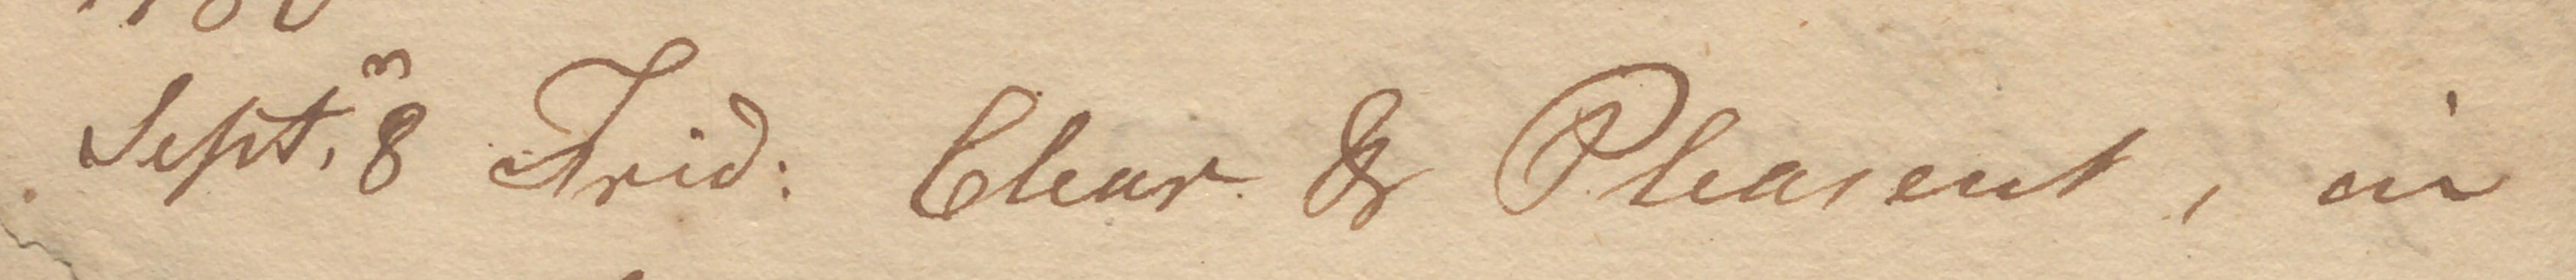Sept^r. 8 Frid: Clear & Pleasent, in
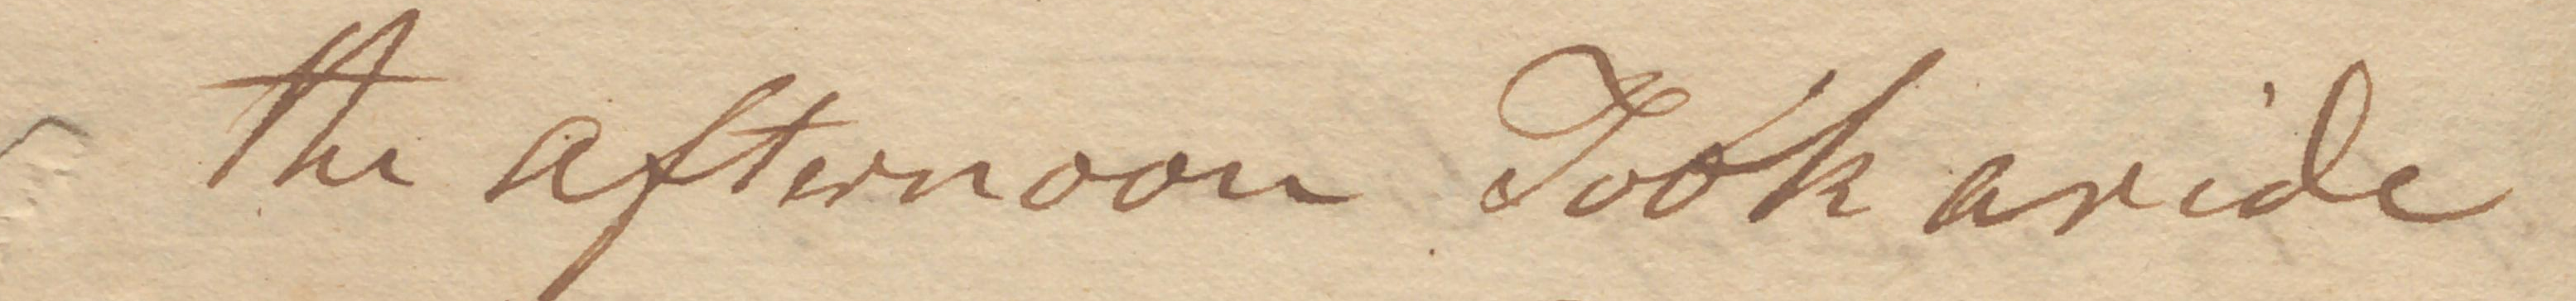the afternoon Took a ride
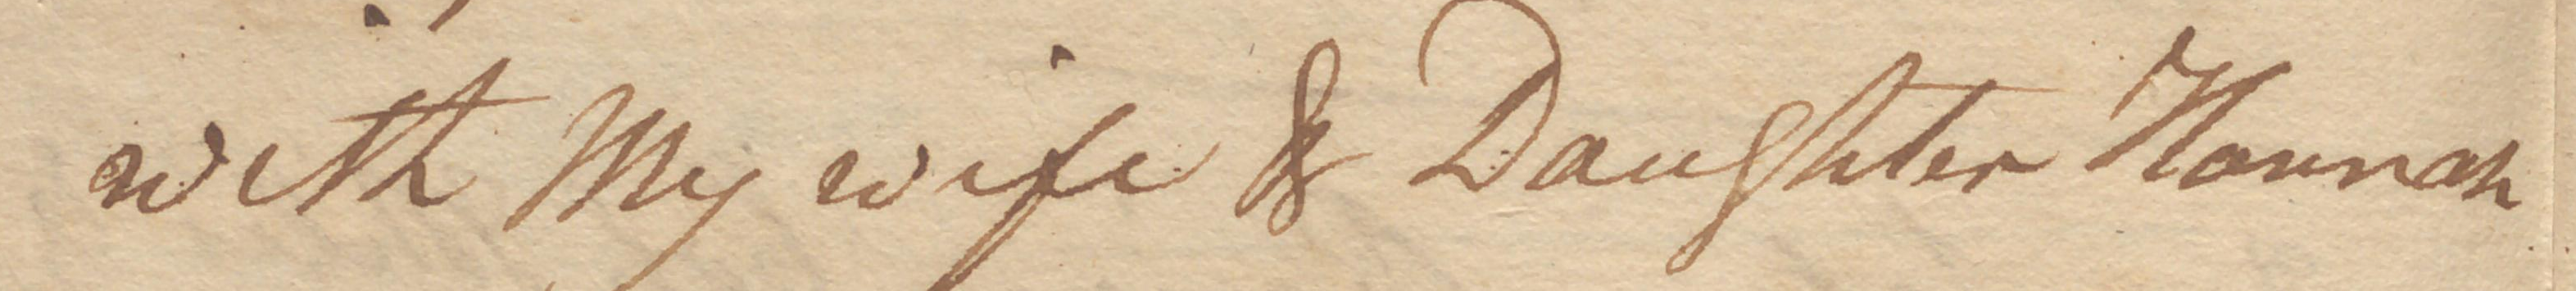with My wife & Daughter Hannah
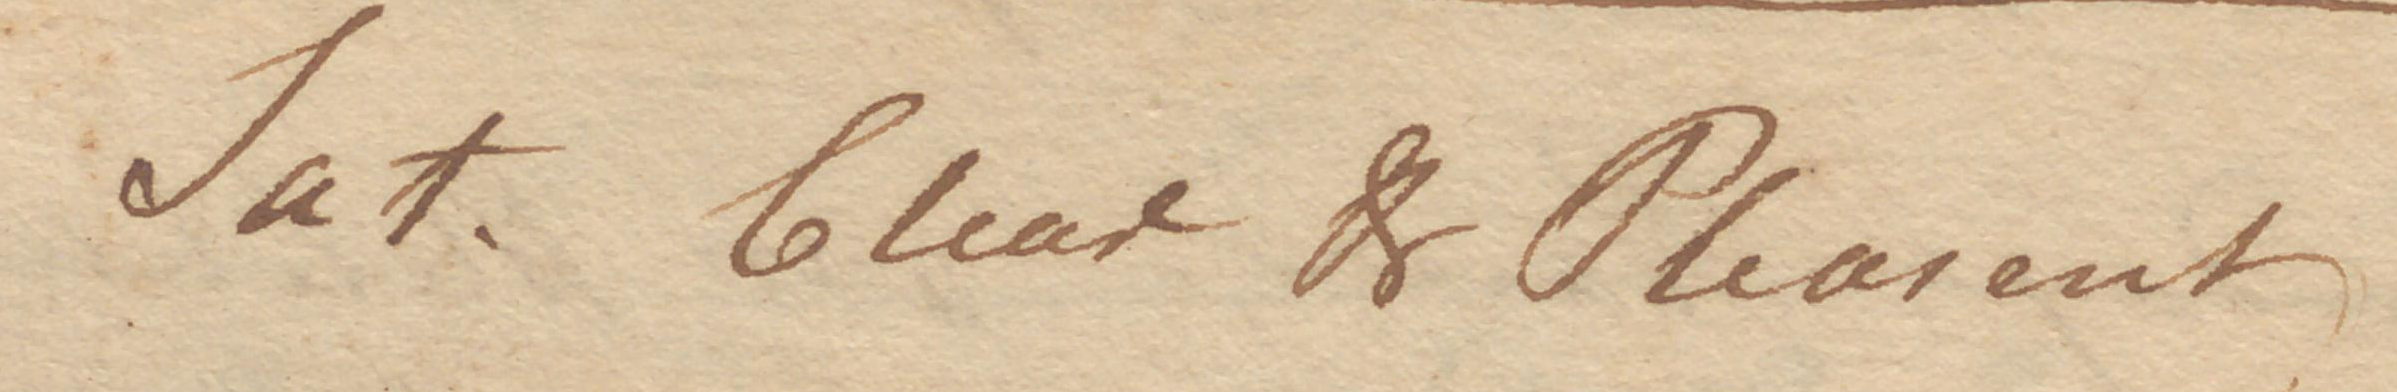Sat. Clear & Pleasent
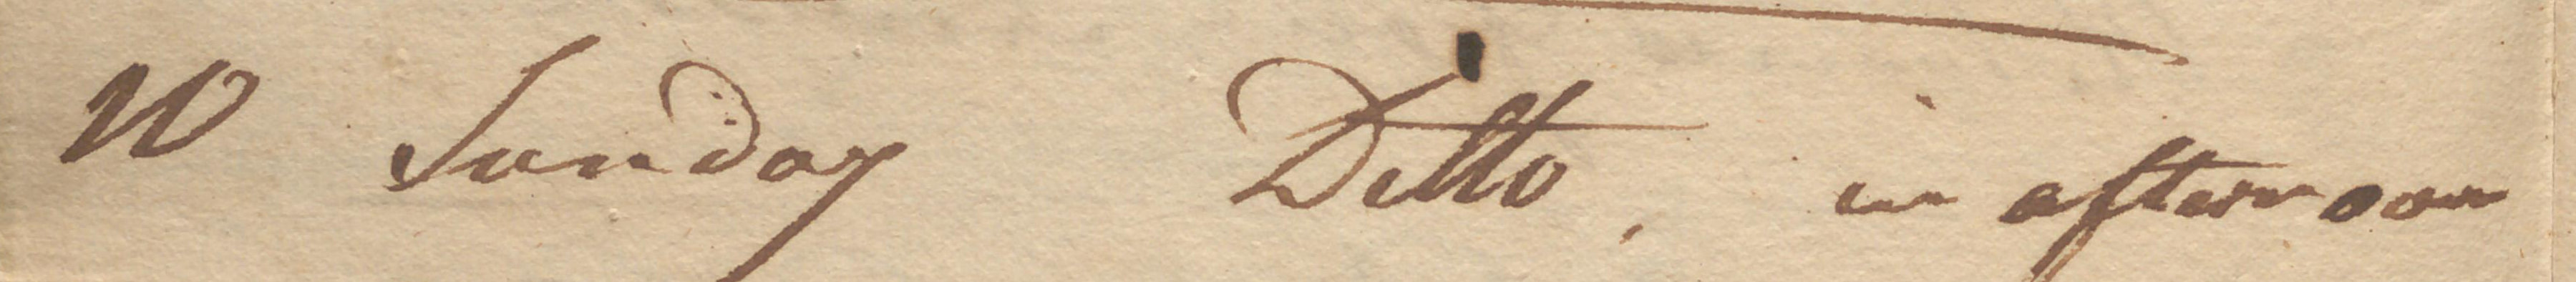10 Sunday Ditto in afternoon
